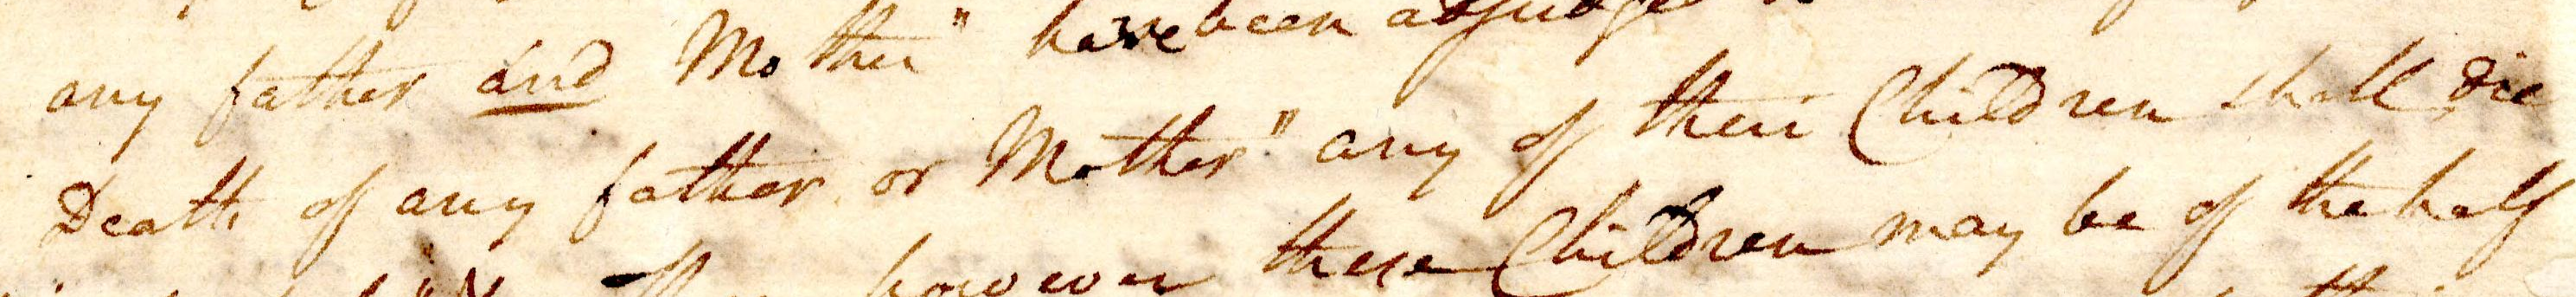Death of any father or Mother" any of their Children shall die
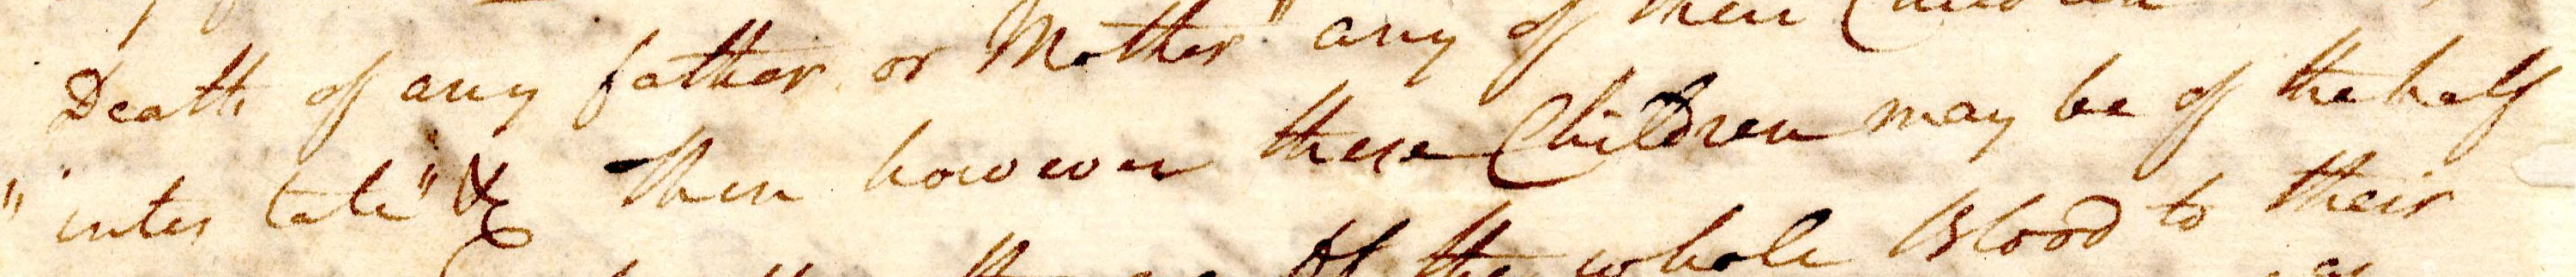"inter tale" &c then however these Children may be of the half
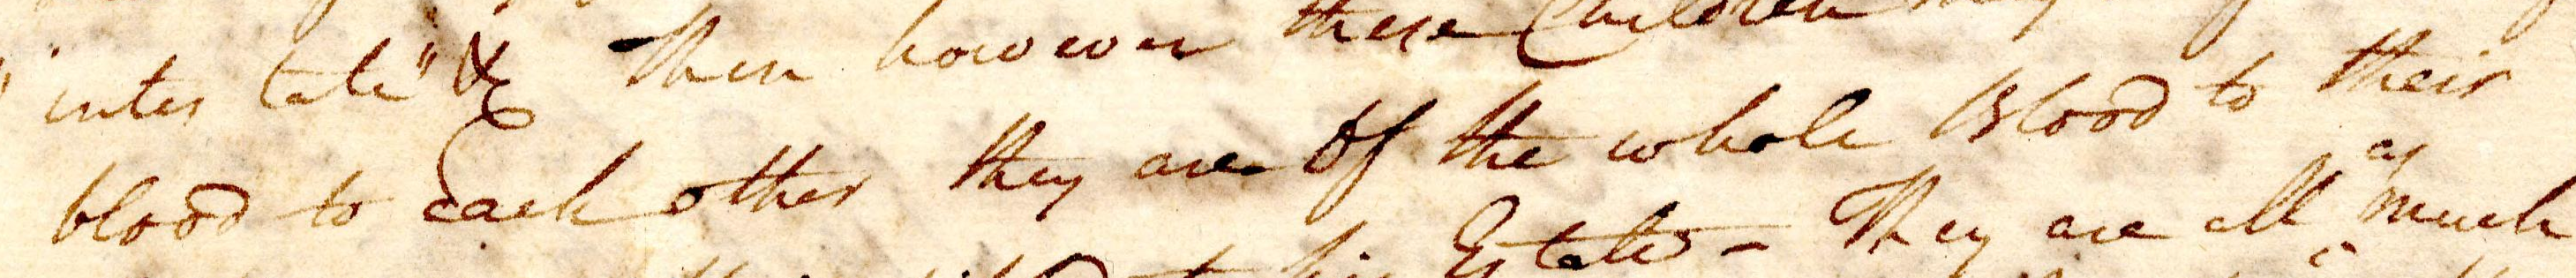blood to each other they are of the whole Blood to their
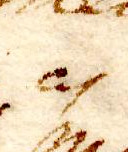as
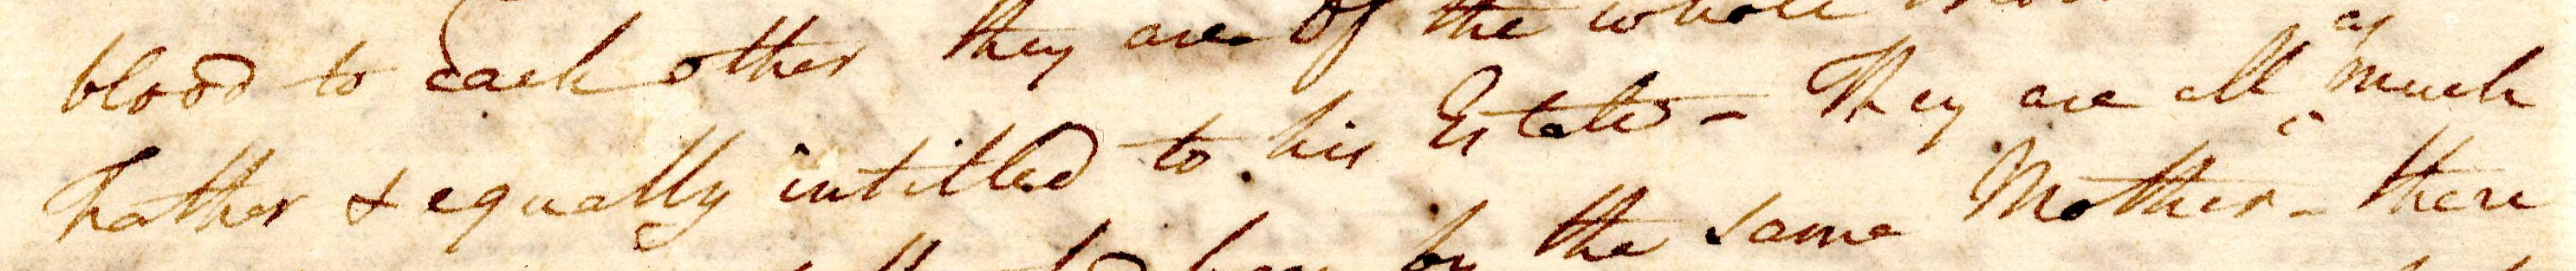Father & equally intitled to his Estate. They are all ^ much
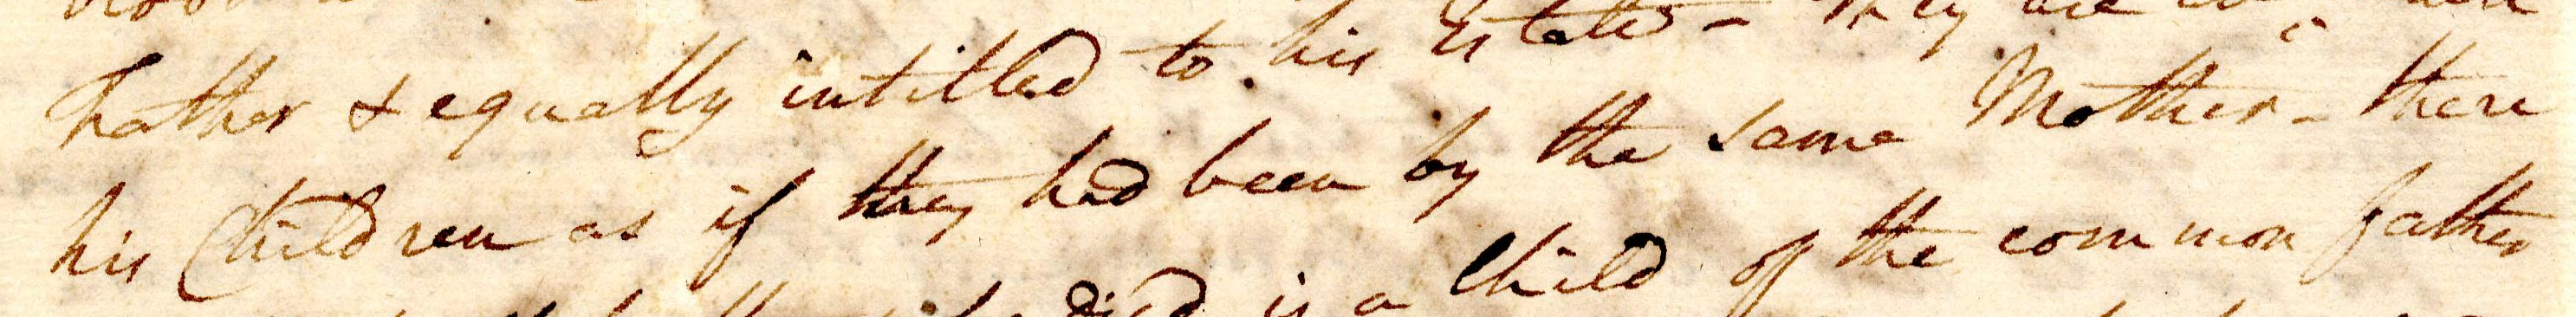his Children as if they had been by the same Mother- there-
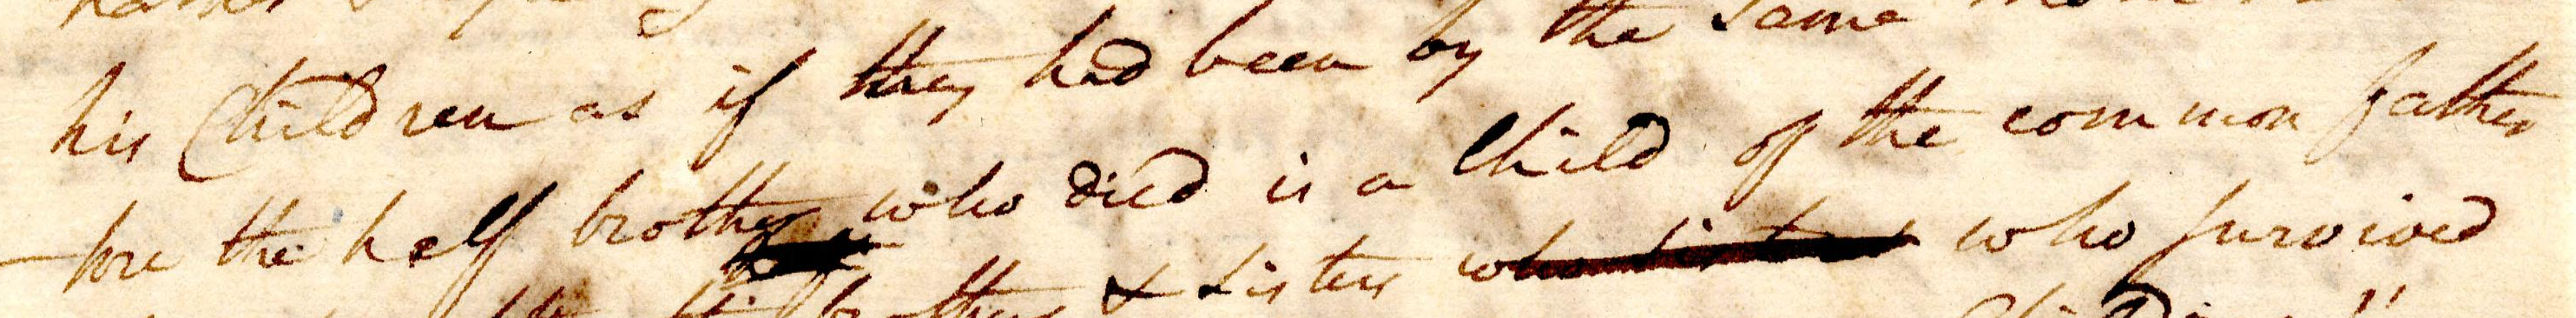-fore the half brother who died is a Child of the common father
